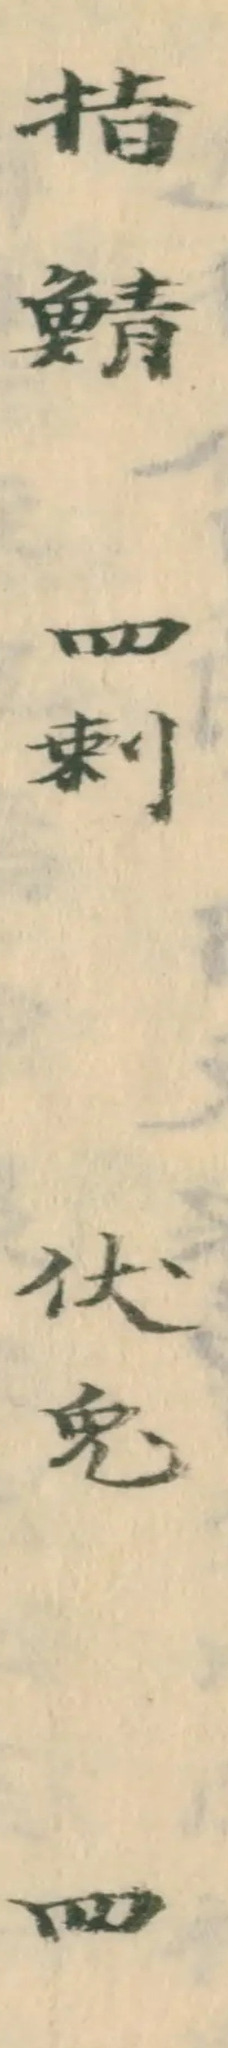指鯖四刺伏兎四
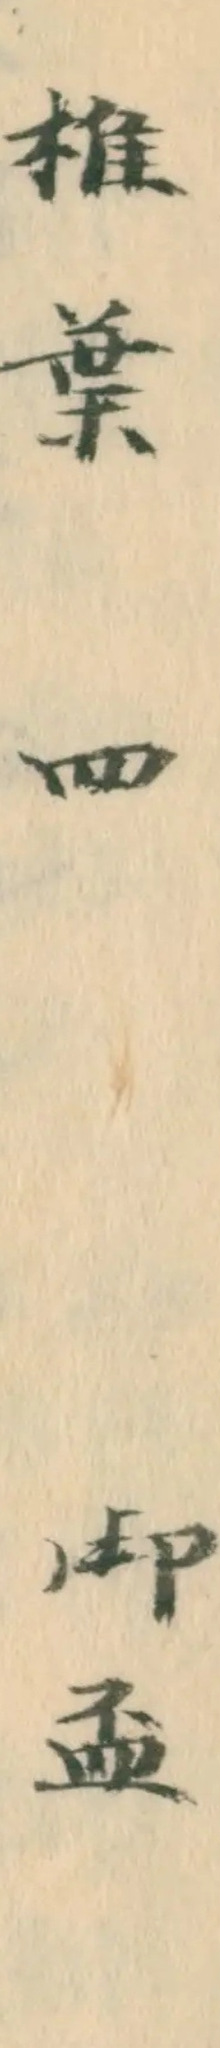椎葉四御盃一
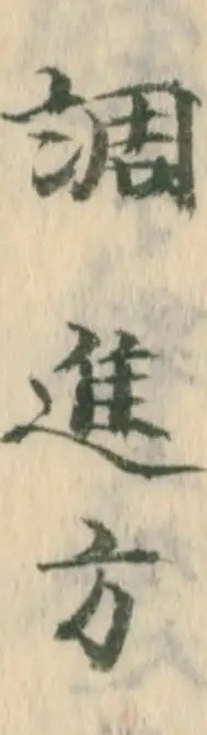調進方

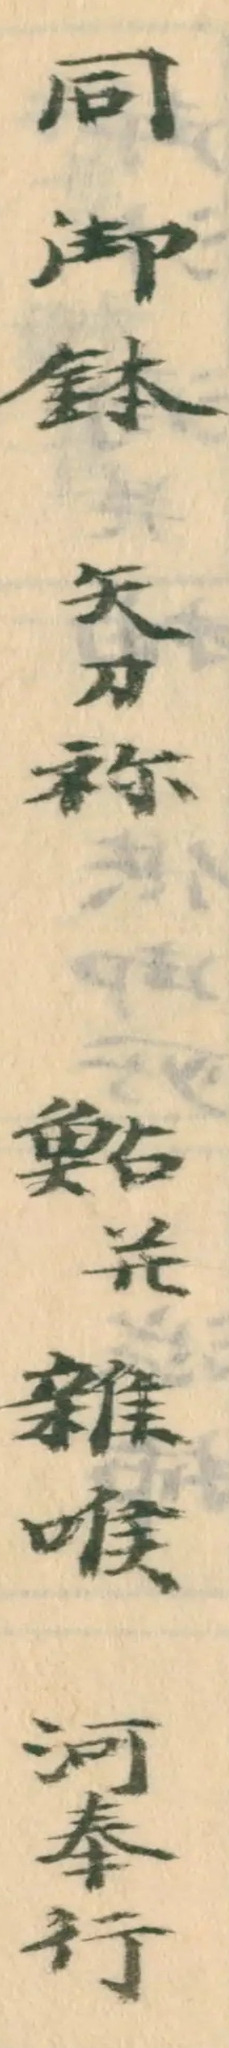同御鉢矢刀禰鮎并雑喉河奉行
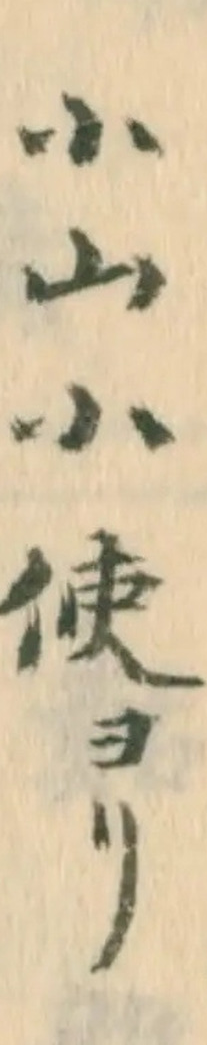小山小使ヨリ
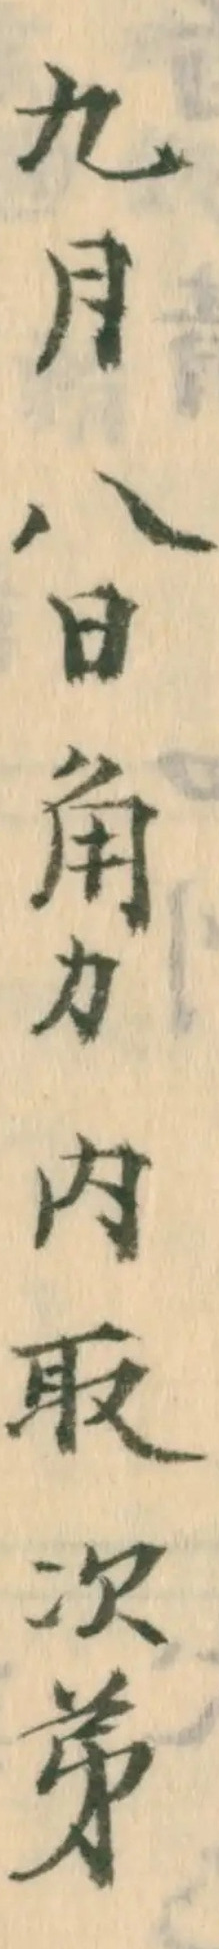九月八日角力内取次第
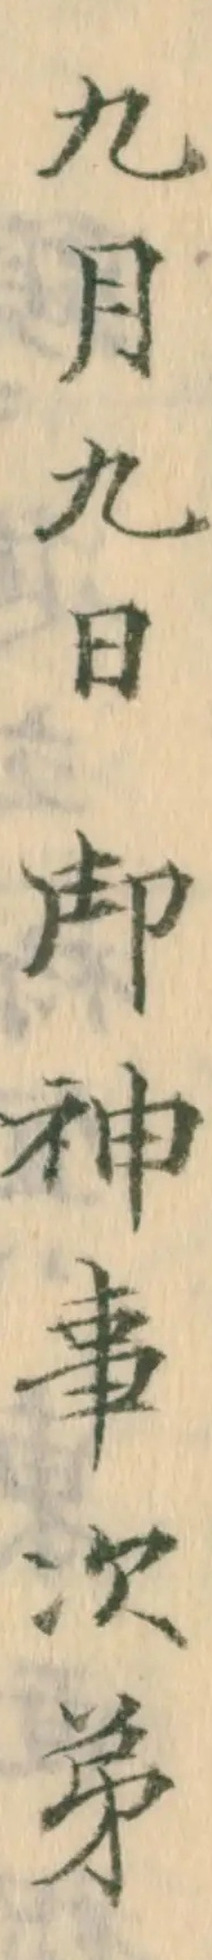九月九日御神事次第
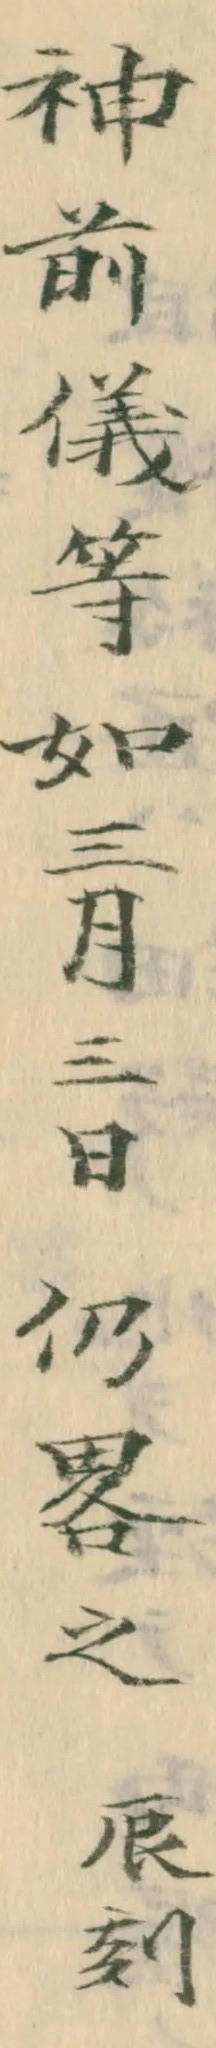神前儀等如三月三日仍略之辰刻
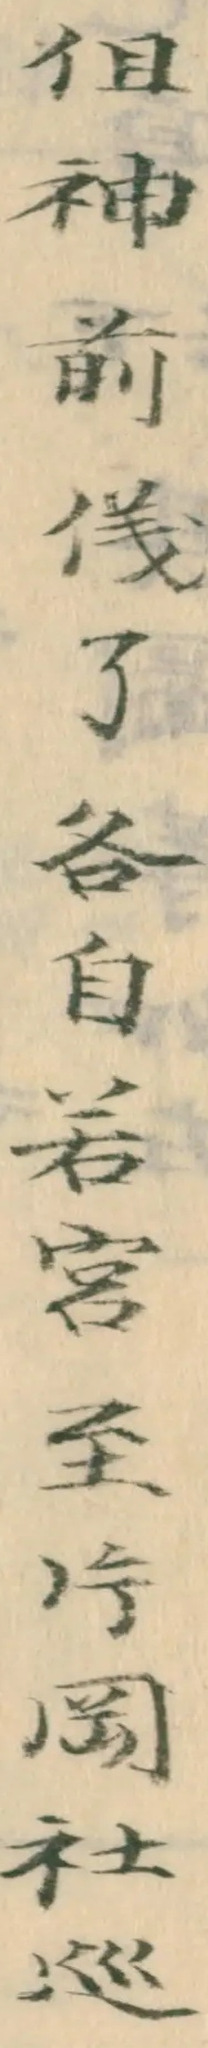但神前儀了各自若宮至片岡社巡
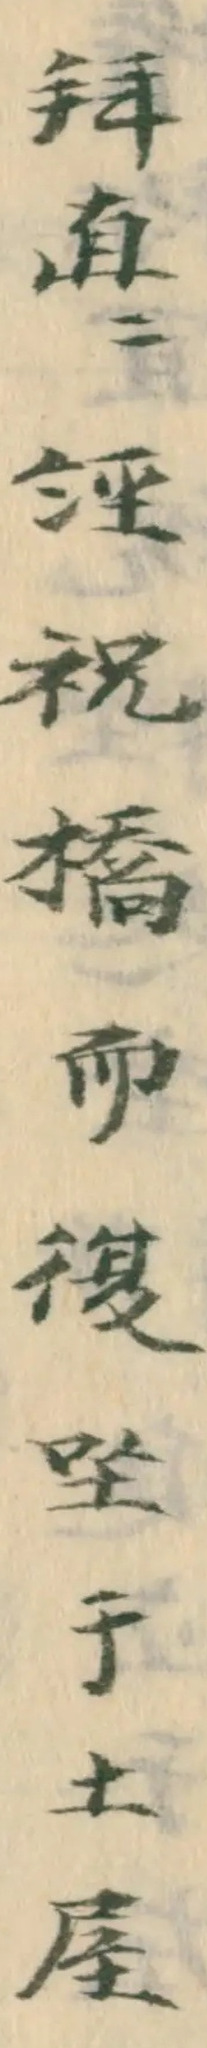拝直ニ経祝橋而復坐于土屋
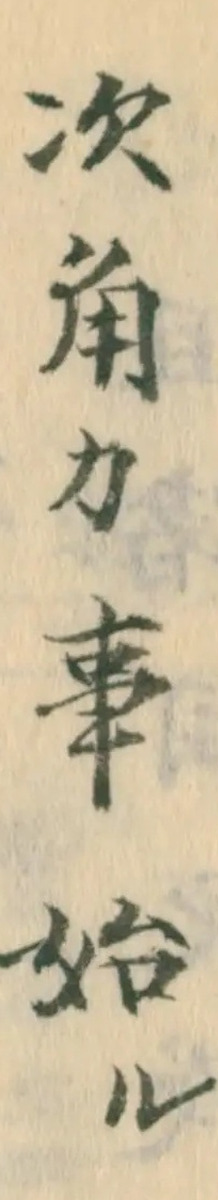次角力事始ル
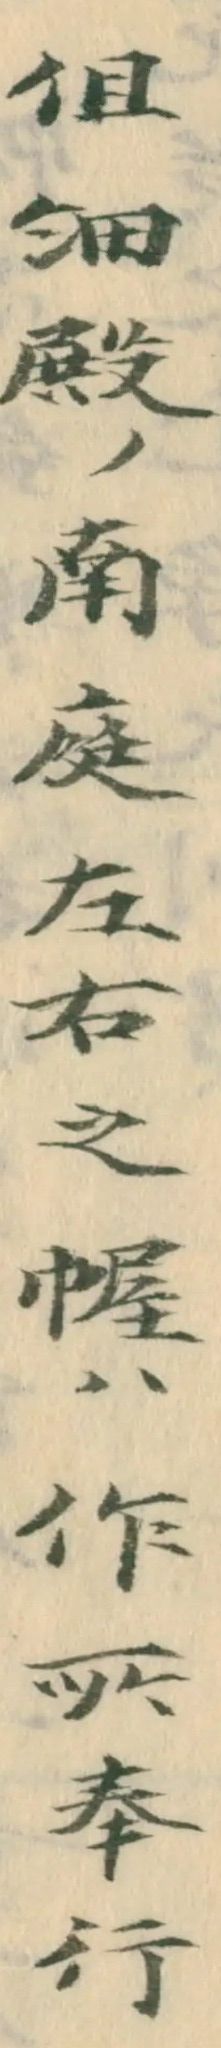但細殿ノ南庭左右之幄ハ作所奉行
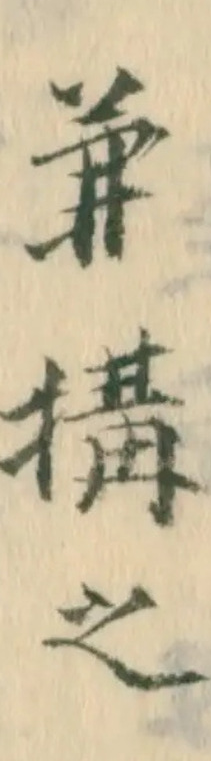兼構之

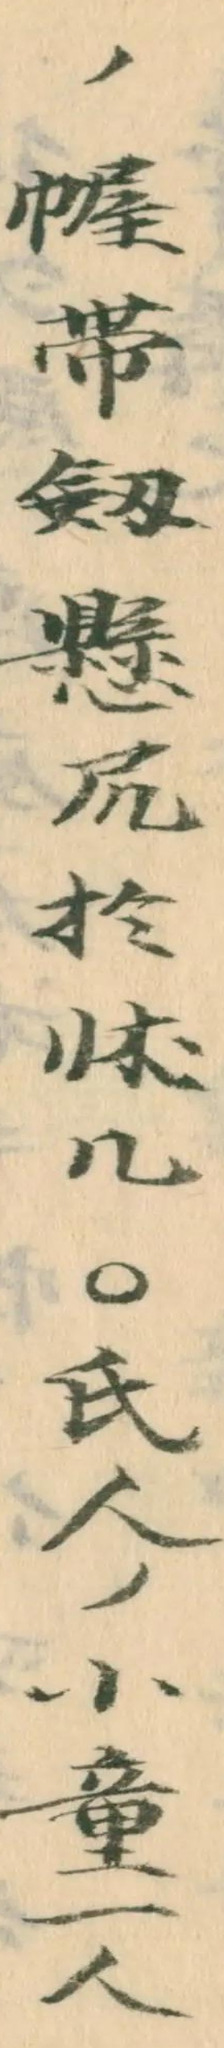ノ幄帯剣懸尻於牀几○氏人ノ小童一人
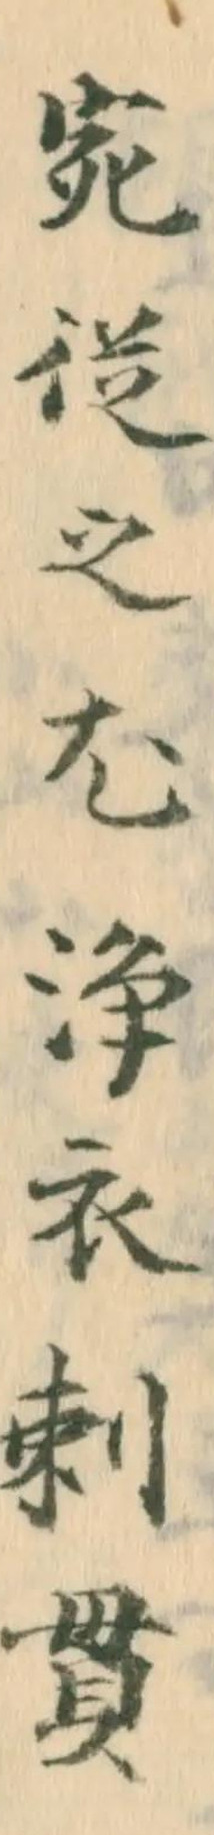宛従之尤浄衣刺貫
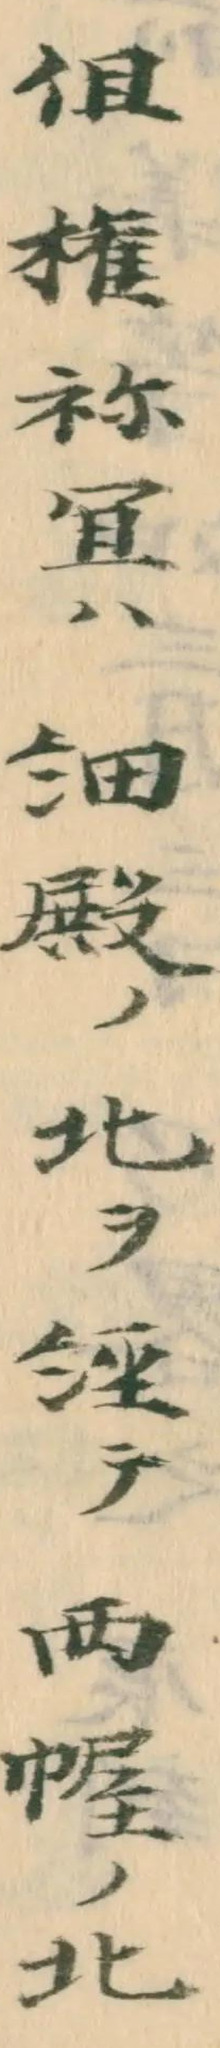但権禰宜ハ細殿ノ北ヲ経テ西幄ノ北
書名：賀茂社記録. 第5冊
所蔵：国立国会図書館 National Diet Library, JAPAN
